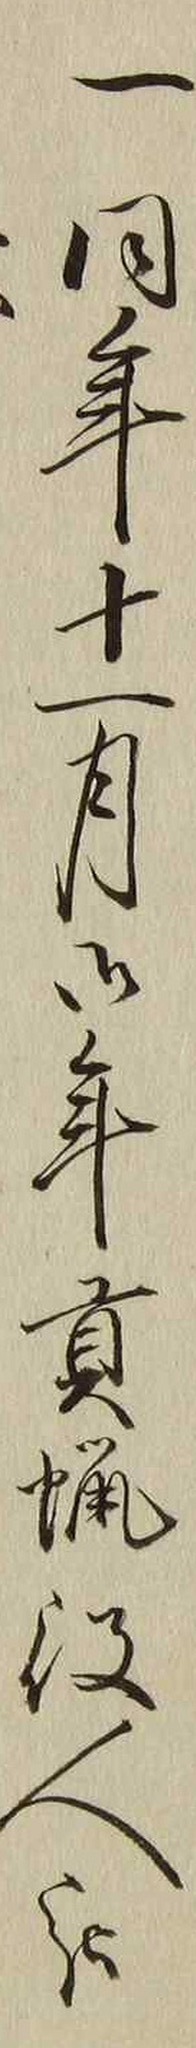一同年十一月御年貢蝋役人被
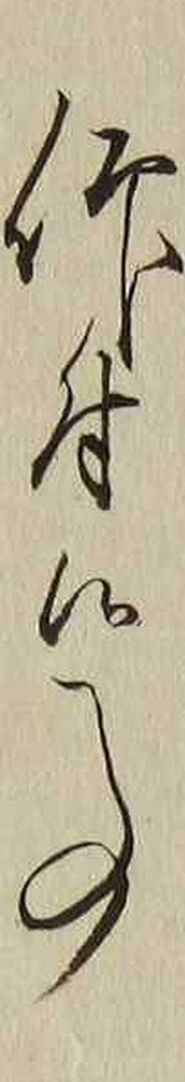仰付候事
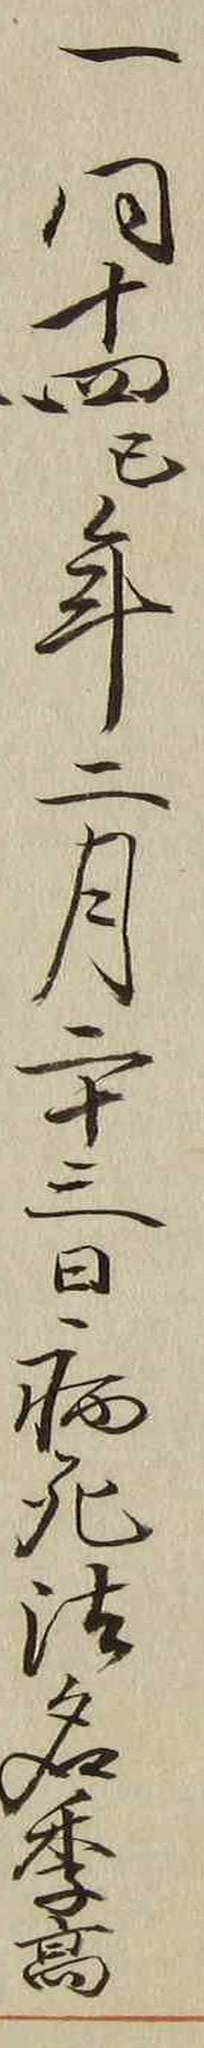一同十四巳年二月二十三日病死法名季高
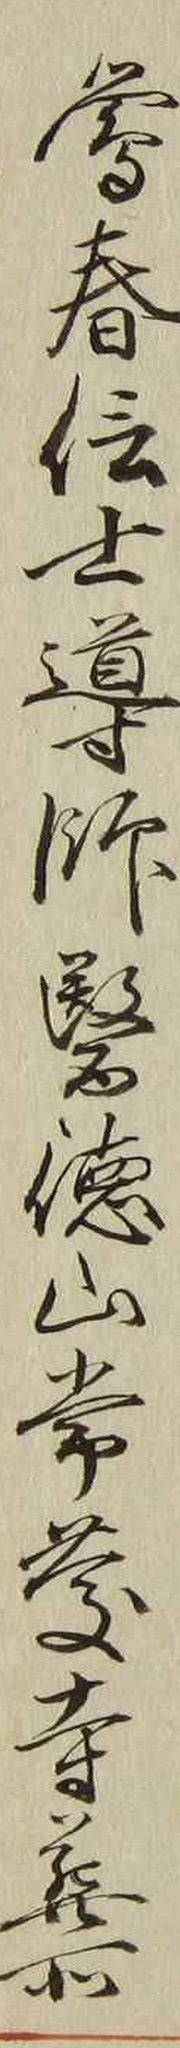鴬春信士導師医徳山常慶寺葬所
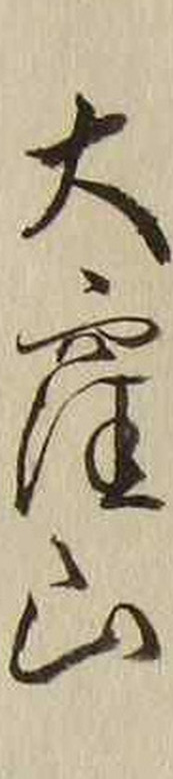大窪山

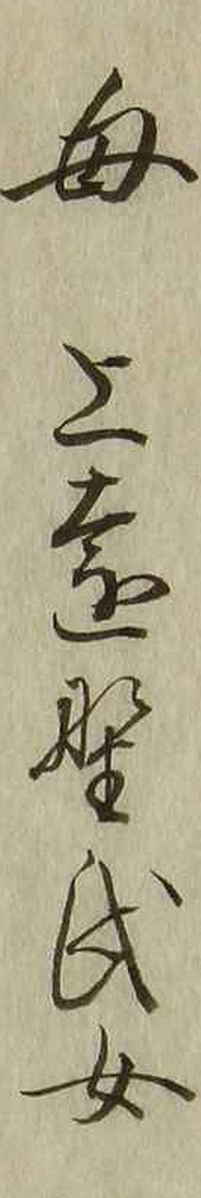母上遠野氏女
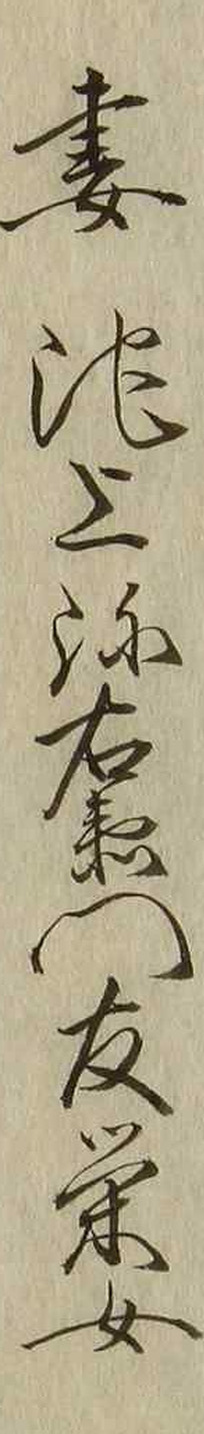妻池上弥右衛門友栄女
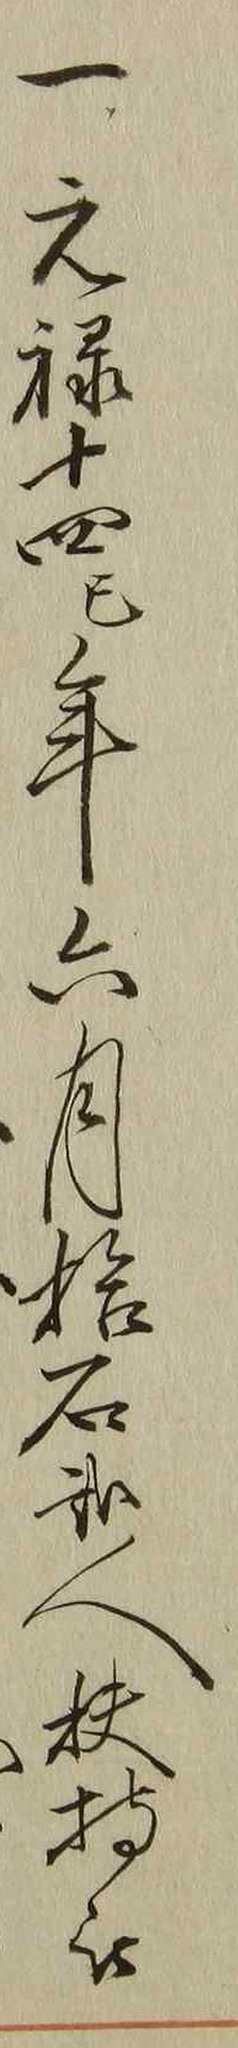一元禄十四巳年六月拾石弐人扶持被
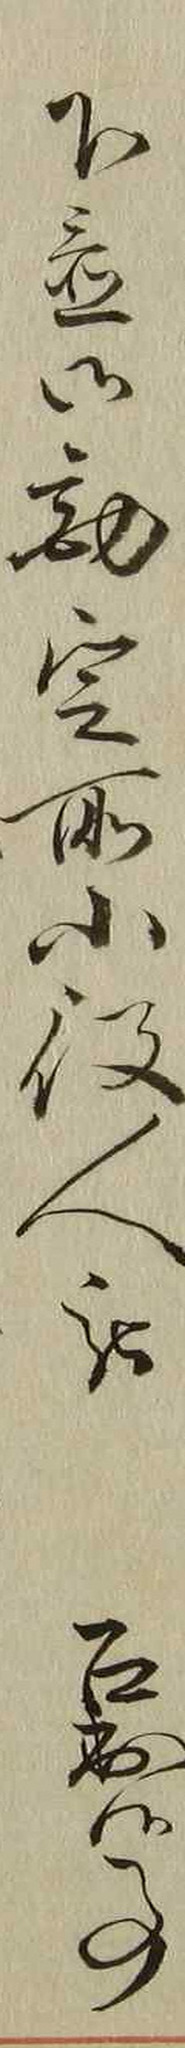下置御勘定所小役人被召出候事
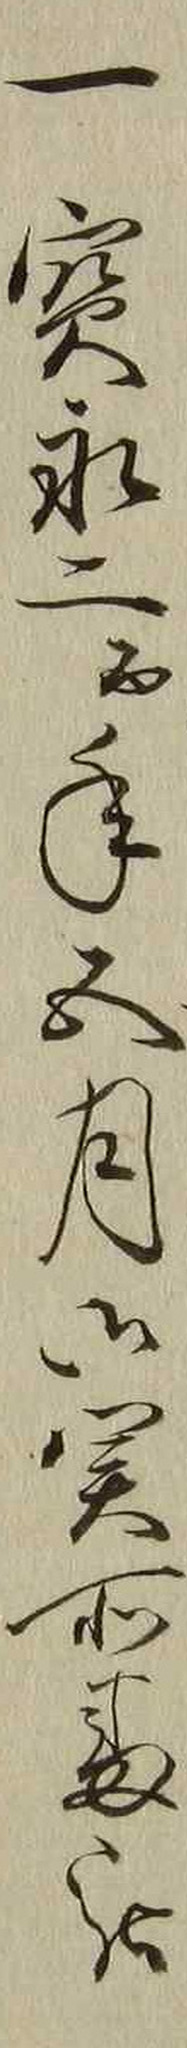一宝永二酉年五月御関所番被
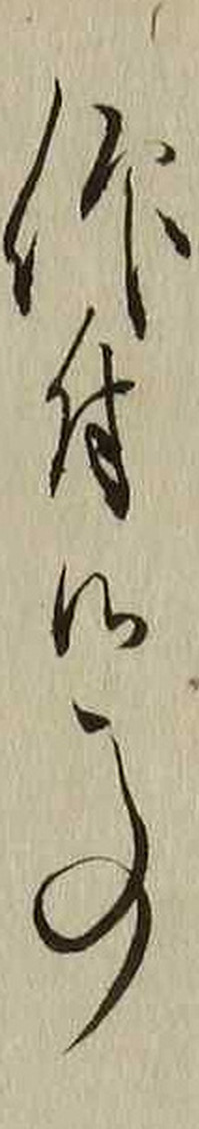仰付候事
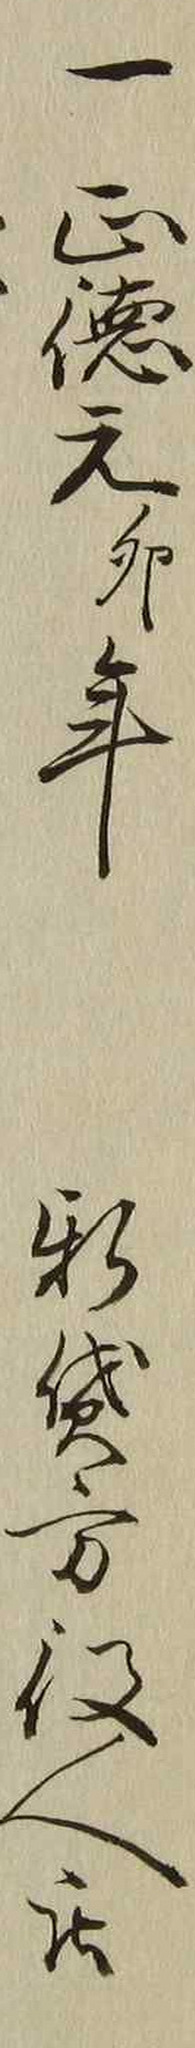一正徳元卯年新貸方役人被
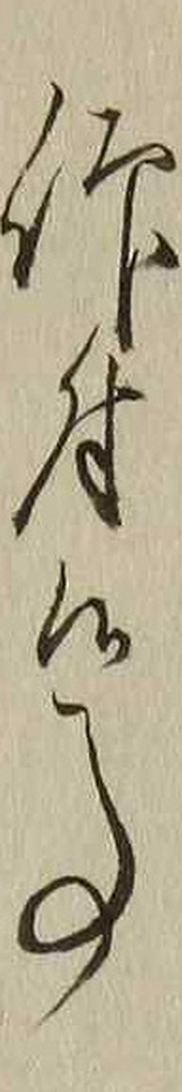仰付候事
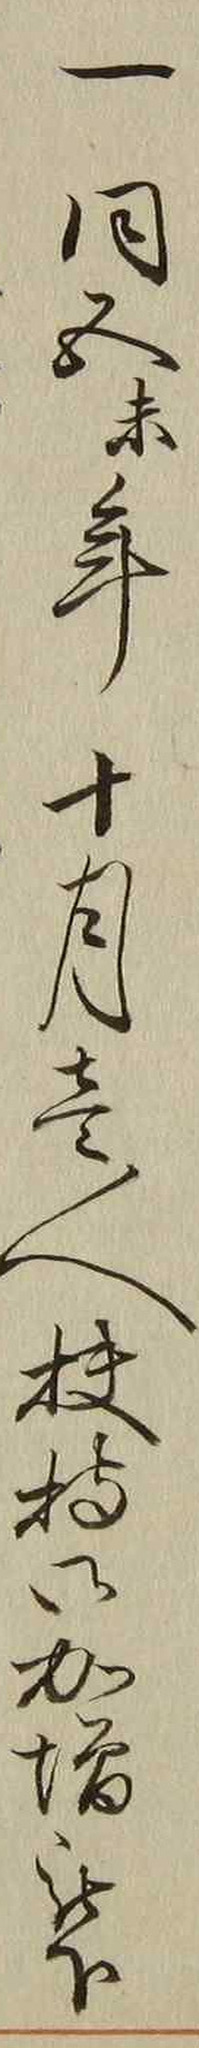一同五未年十月壱人扶持御加増被下
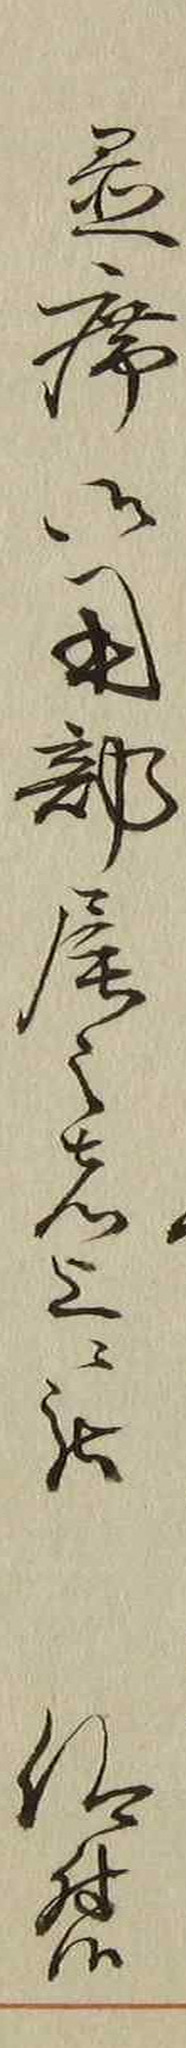置席御用部屋之者上ニ被仰付候
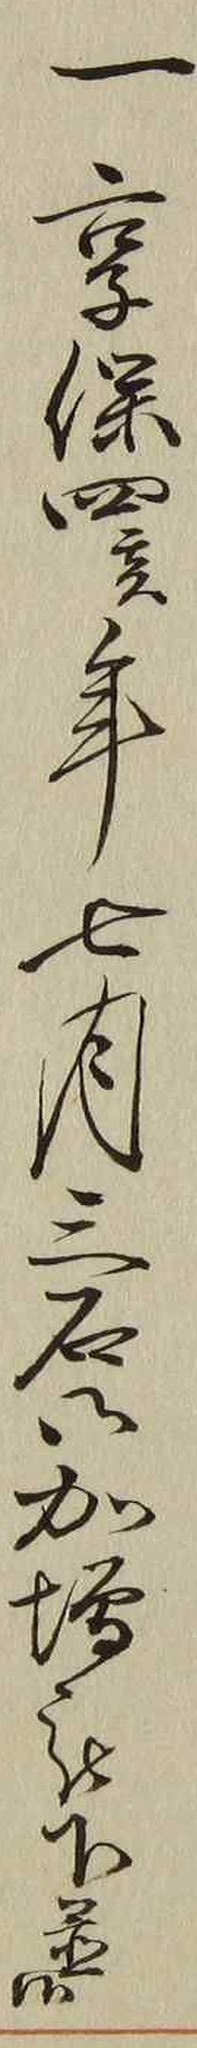一享保四亥年七月三石御加増被下置候
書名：諸士系譜　巻之57　ほ之部4
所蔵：会津若松市立会津図書館
